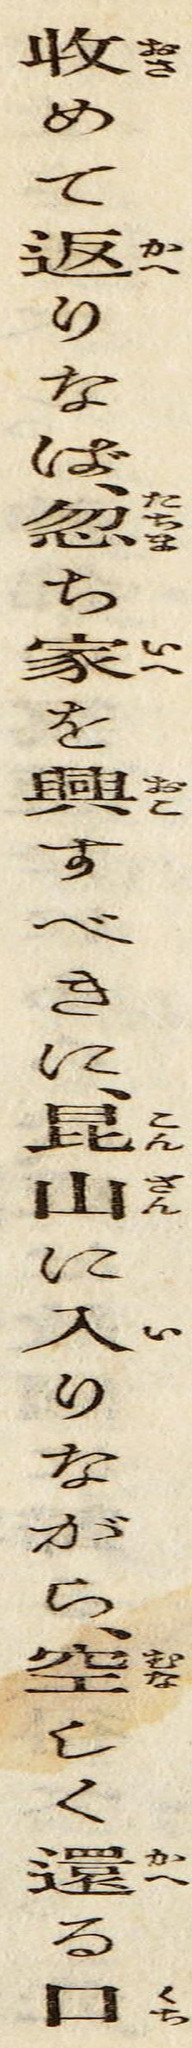収めて返りなば、忽ち家を興すべきに、昆山に入りながら、空しく還る口
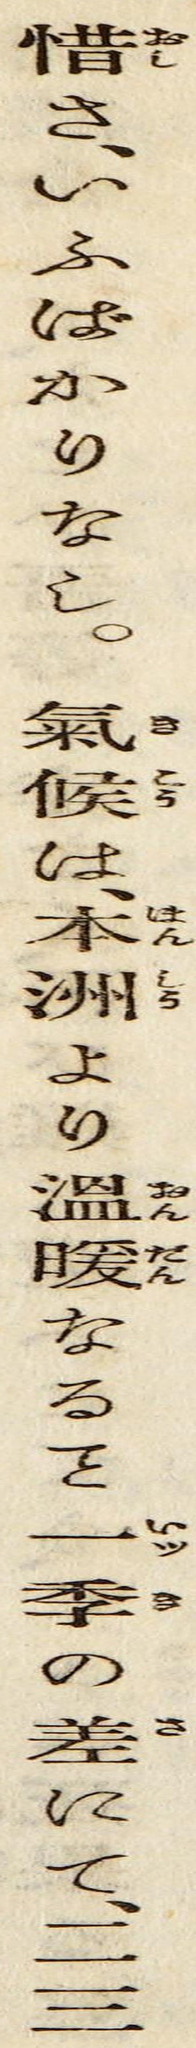惜さ、いふばかりなし。気候は、本洲より温暖なること一季の差にて、二三
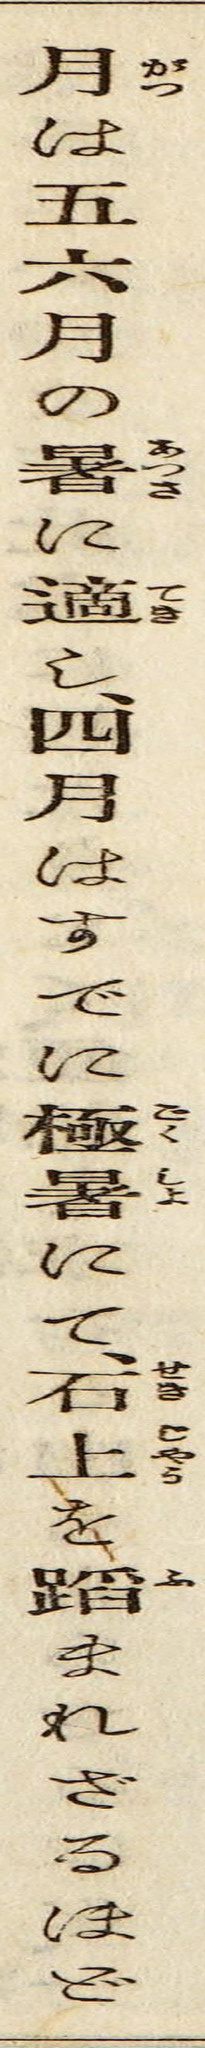月は五六月の暑に適し、四月はすでに極暑にて、石上を蹈まれざるほど
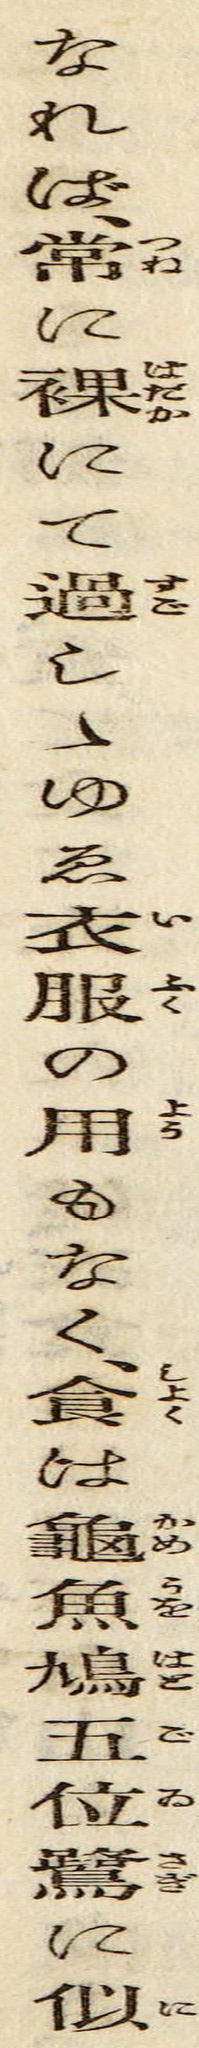なれば、常に裸にて過しゝゆゑ衣服の用もなく、食は亀魚鳩五位鷺に似

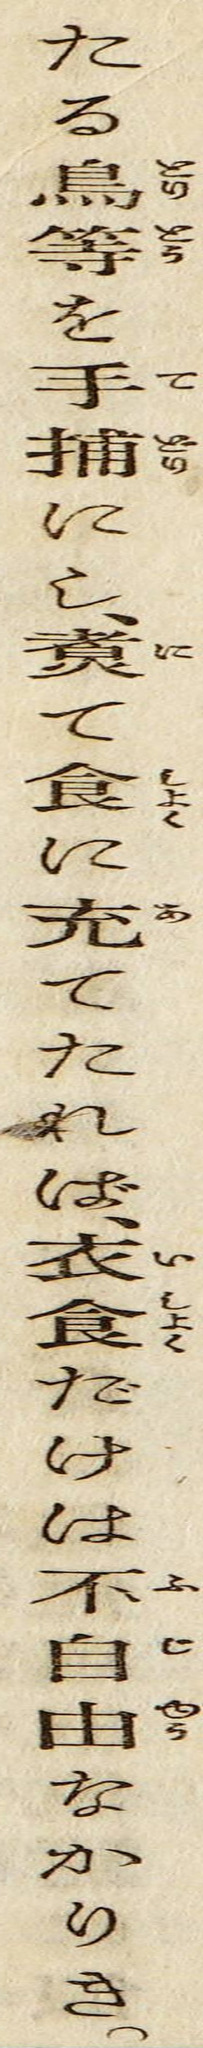たる鳥等を手捕にし、煮て食に充てたれば、衣食だけは不自由なかりき。
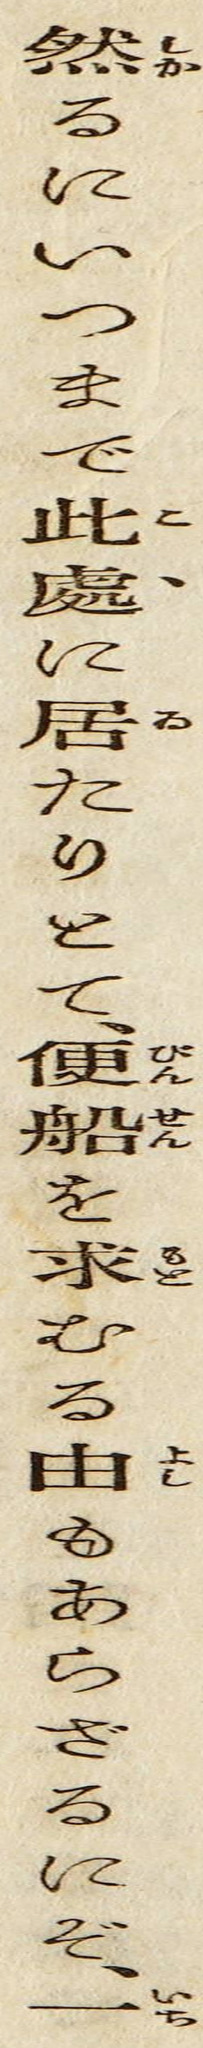然るにいつまで此処に居たりとて、便船を求むる由もあらざるにぞ、一
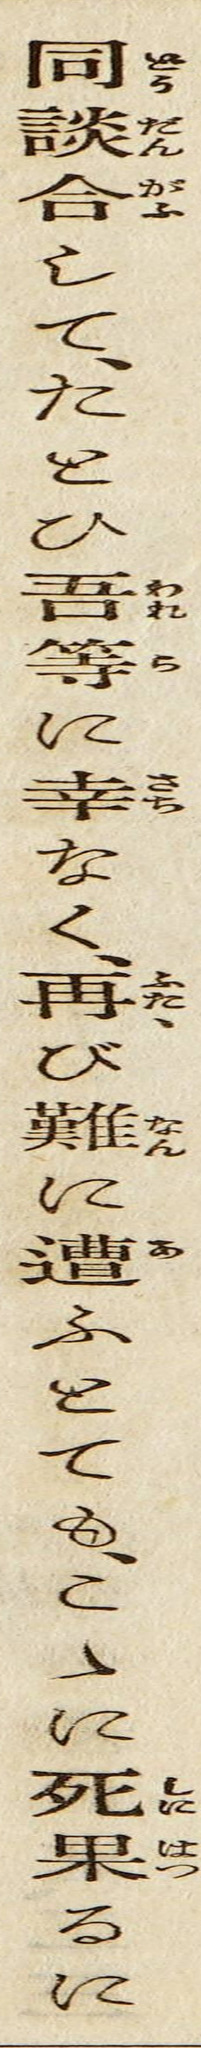同談合して、たとひ吾等に幸なく、再び難に遭ふとても、こゝに死果るに
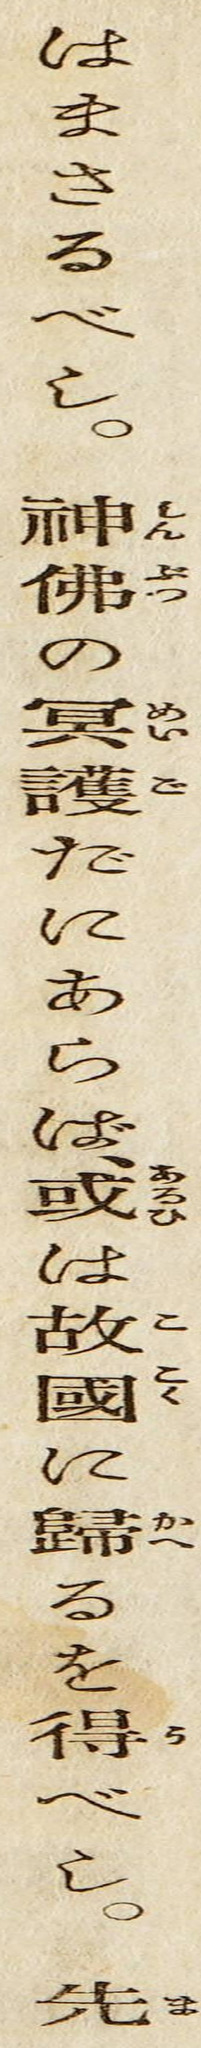はまさるべし。神仏の冥護だにあらば、或は故国に帰るを得べし。先
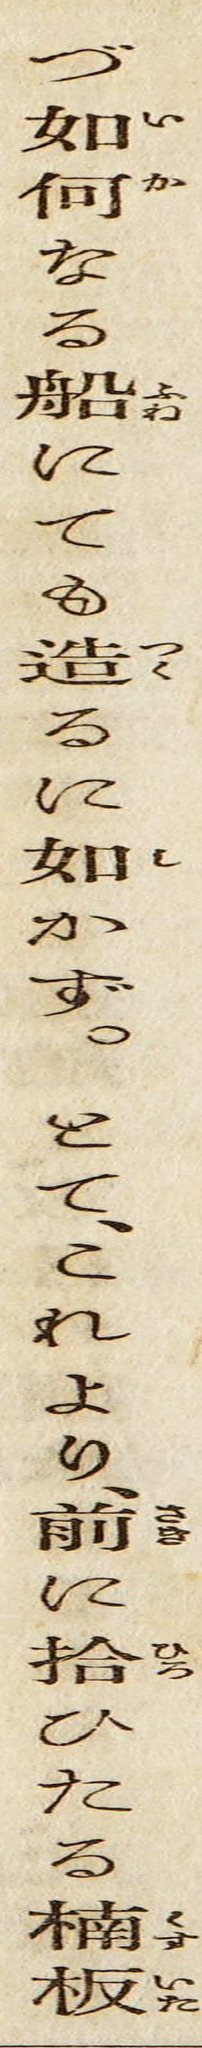づ如何なる船にても造るに如かず。とて、これより、前に拾ひたる楠板
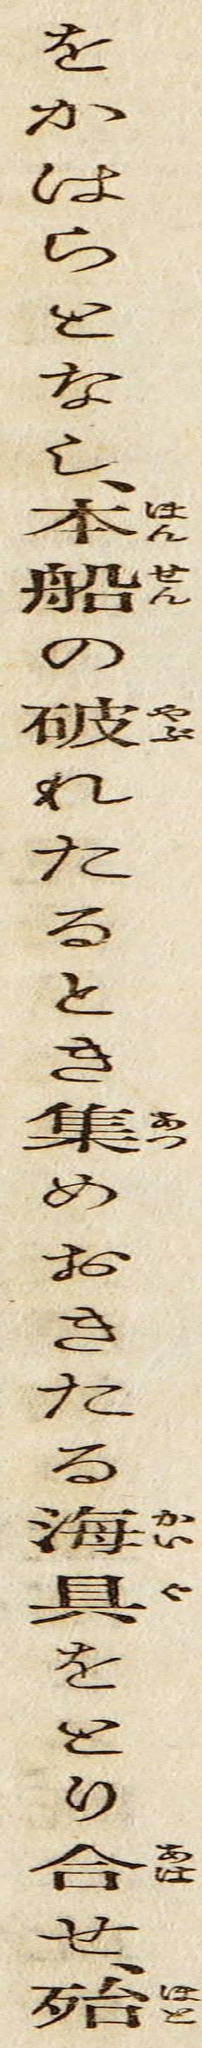をかはらとなし、本船の破れたるとき集めおきたる海具をとり合せ、殆
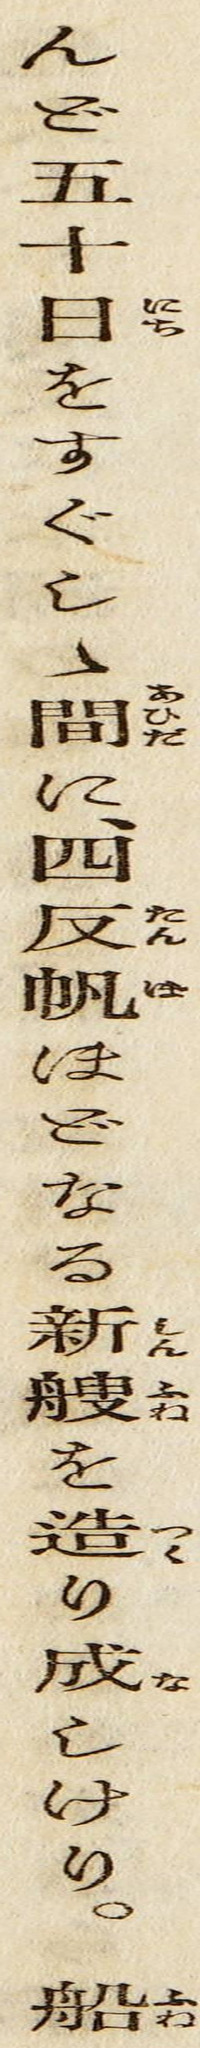んど五十日をすぐしゝ間に、四反帆ほどなる新艘を造り成しけり。船
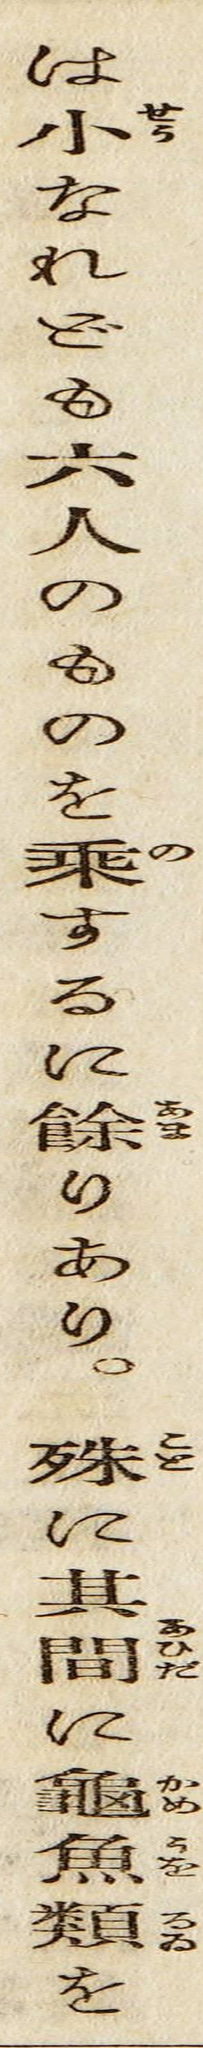は小なれども六人のものを乗するに余りあり。殊に其間に亀魚類を
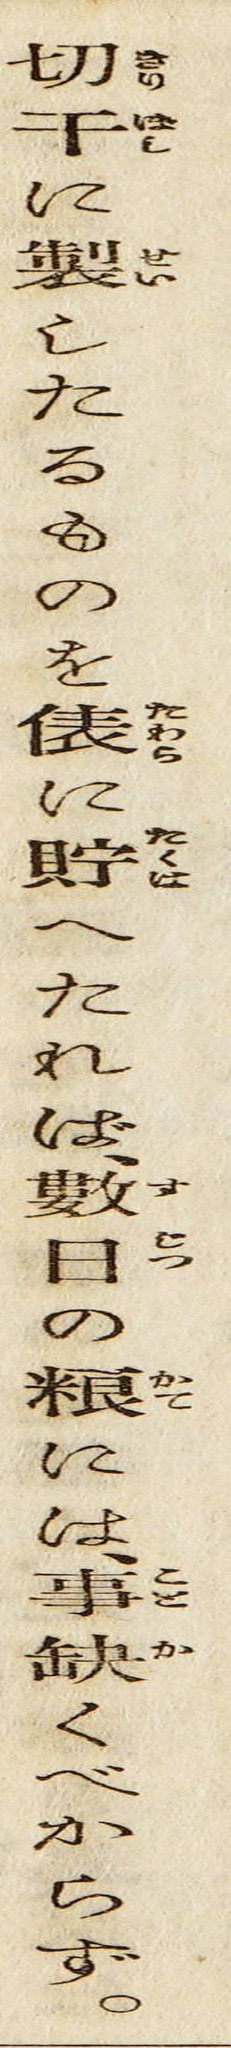切干に製したるものを俵に貯へたれば、数日の糧には、事欠くべからず。
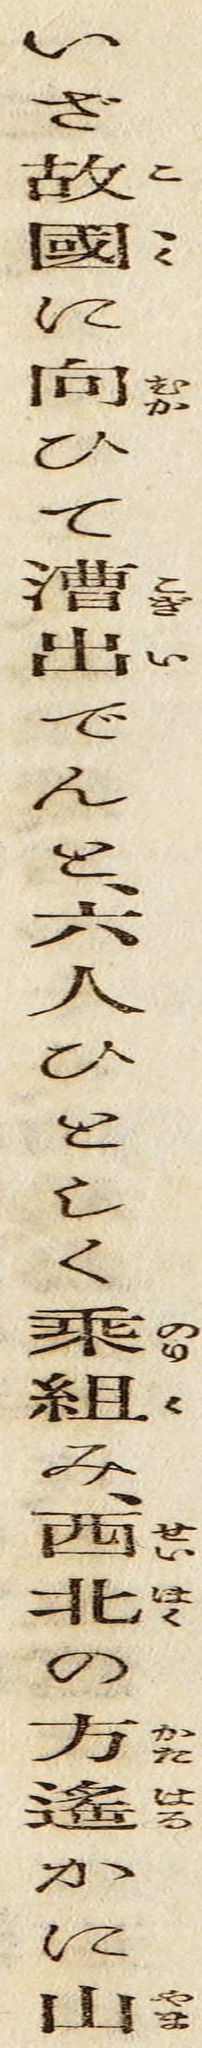いざ故国に向ひて漕出でんと、六人ひとしく乗組み、西北の方遥かに山
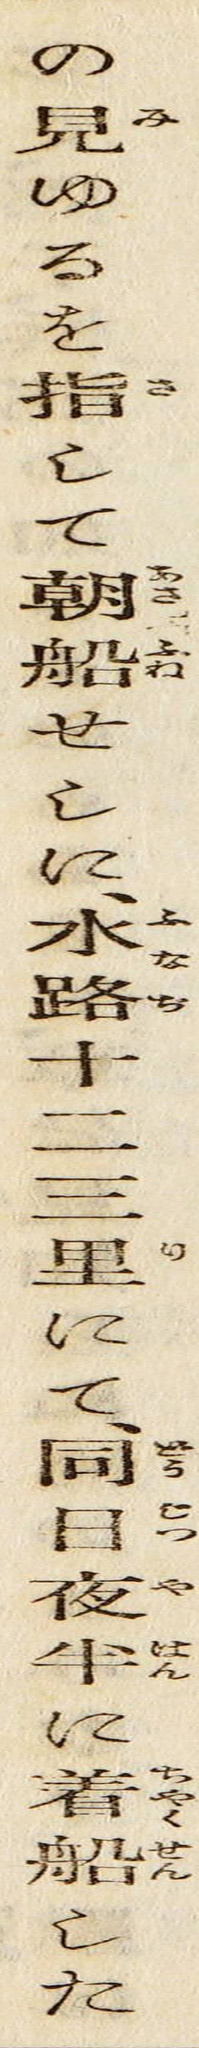の見ゆるを指して朝船せしに、水路十二三里にて、同日夜半に着船した
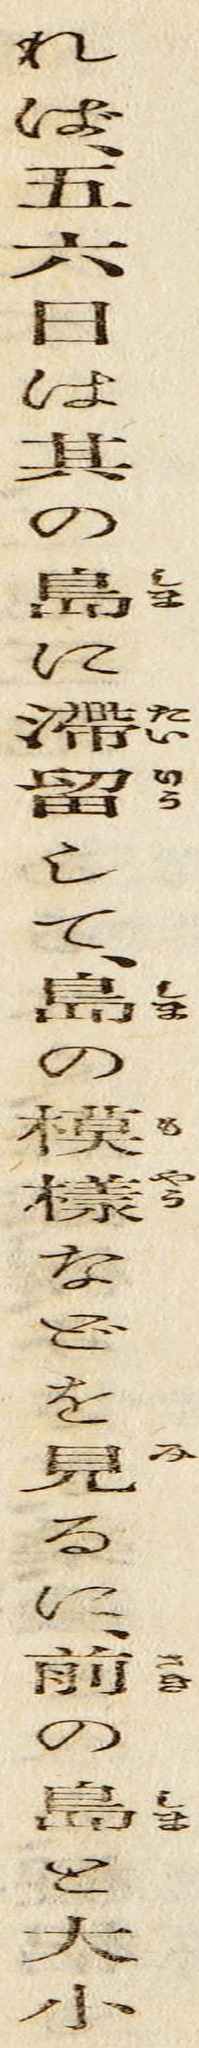れば、五六日は其の島に滞留して、島の模様などを見るに、前の島と大小
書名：日本漂流譚
